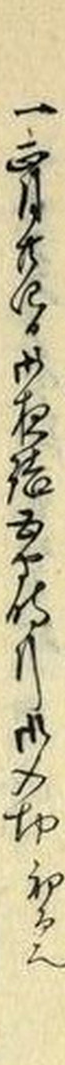一正月廿四日御夜詰五半時引御〆切初而也
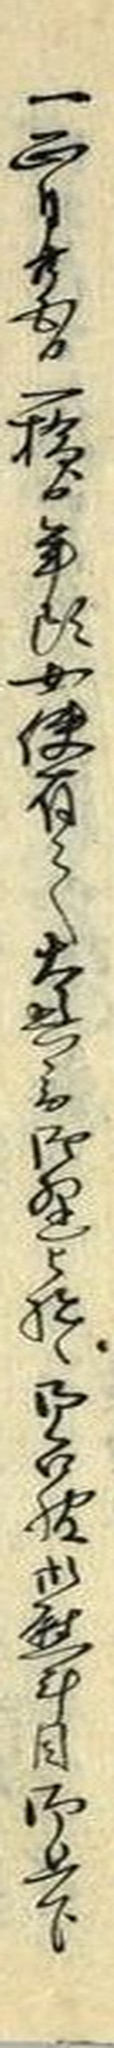一正月廿五日一橋様ゟ年頭女使有之大奥ニ而御逢被遊候御召服御熨斗目御上下
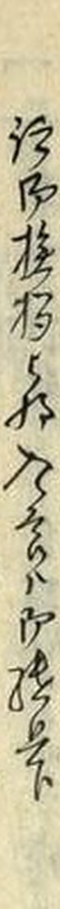跡御挨拶被為入候節ハ御継上下
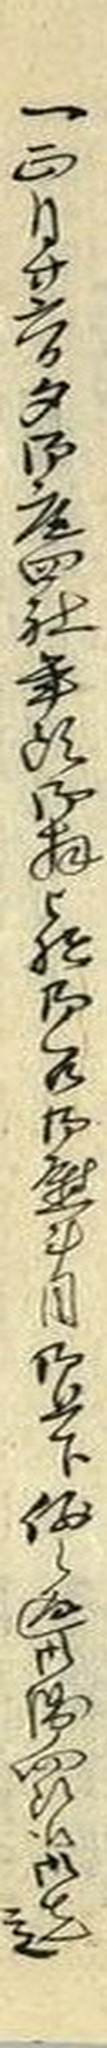一正月廿六日夕御庭四社年頭御拝被遊御召御熨斗目御上下例之通御側向頭取御先立
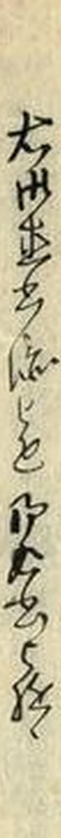右御直書添被進御返書被遊候
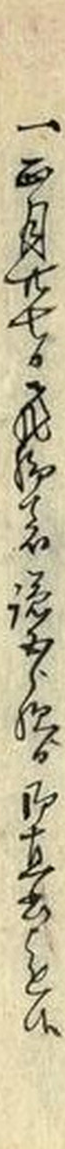一正月廿七日飛脚着謙五郎様ゟ御直書被進候
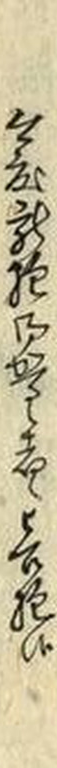今度新抱御駕之者へ被召抱候
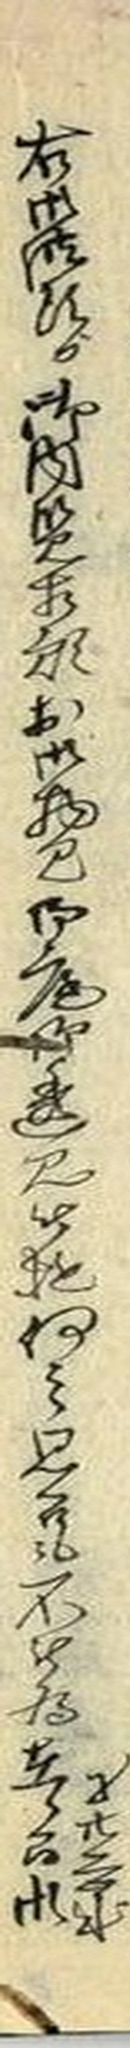右御供頭ゟ御内覧相願於御物見御庭御透見被遊何之思召も不被為在候間御
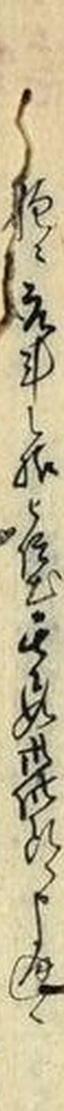抱ニ取斗候様被仰出其如御供頭へ申通候
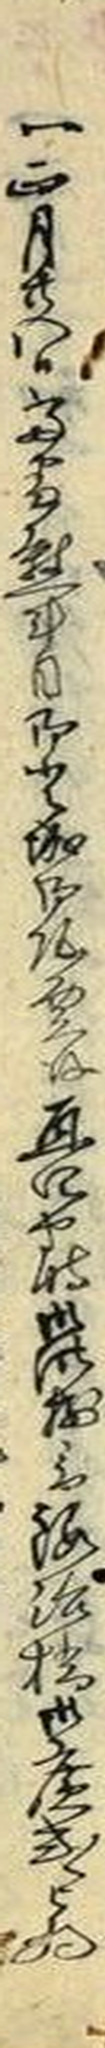一正月廿八日当番熨斗目御登城御帰殿後再四半時御供揃ニ而鍛冶橋御広式へ被為

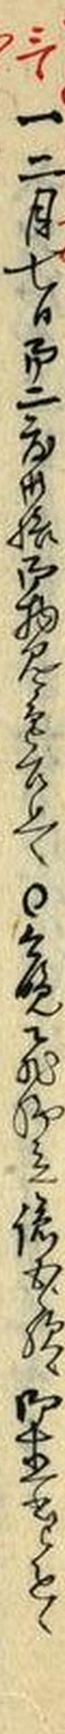一二月七日御二度御膳御物見ニ而被召上候○今晩飛脚立謙五郎様へ御直書被進候
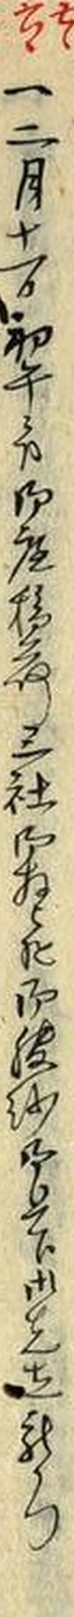一二月十一日初午ニ付御庭稲荷三社御拝被遊御服紗御上下御先立新右衛門
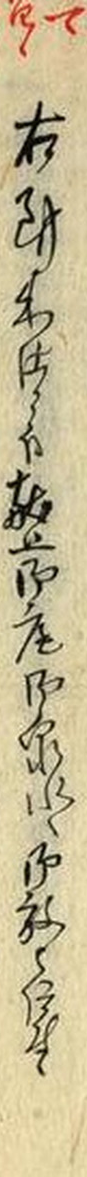右到来仕候ニ付献上御庭御泉水へ御放被仰付候
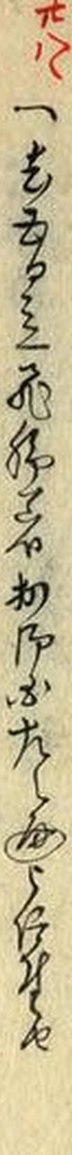一去五日立飛脚着於御国左之通被仰付候由
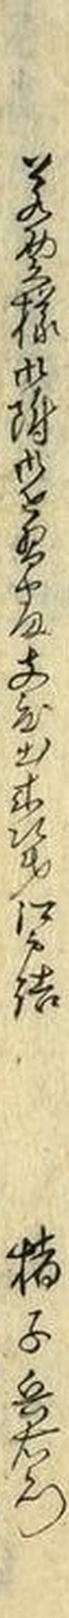若殿様御附御近習番支度出来次第江戸詰猪子兵右衛門
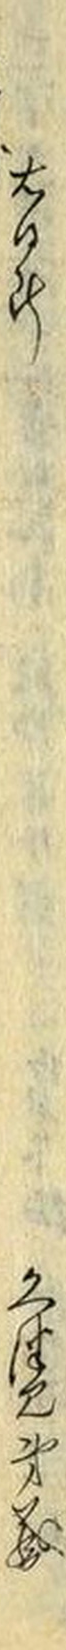右同断久津見第蔵
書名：少傅日録抄（斉承付側向頭取日記、在府）
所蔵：福井県文書館 Fukui Prefectural Archives
